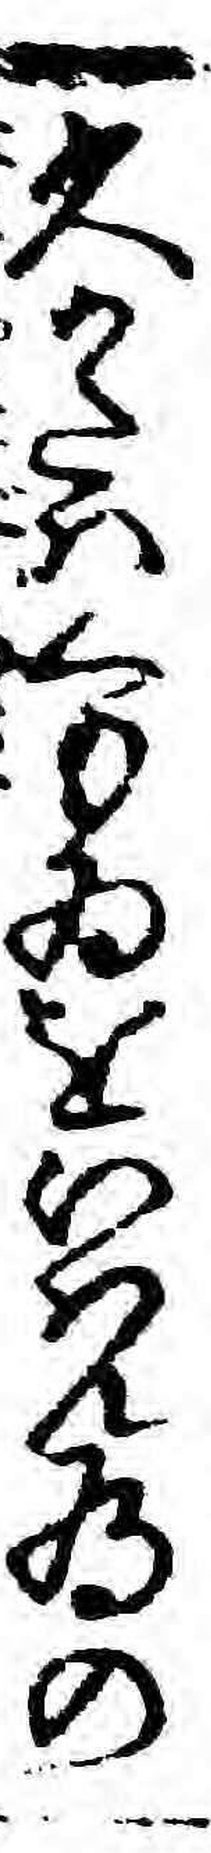久かたはくもゐをいはん為の
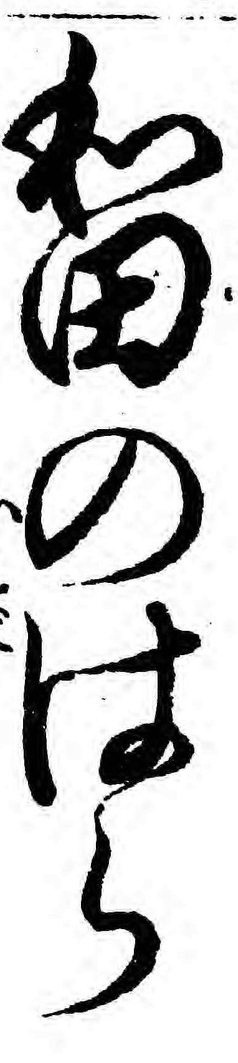和田のはら
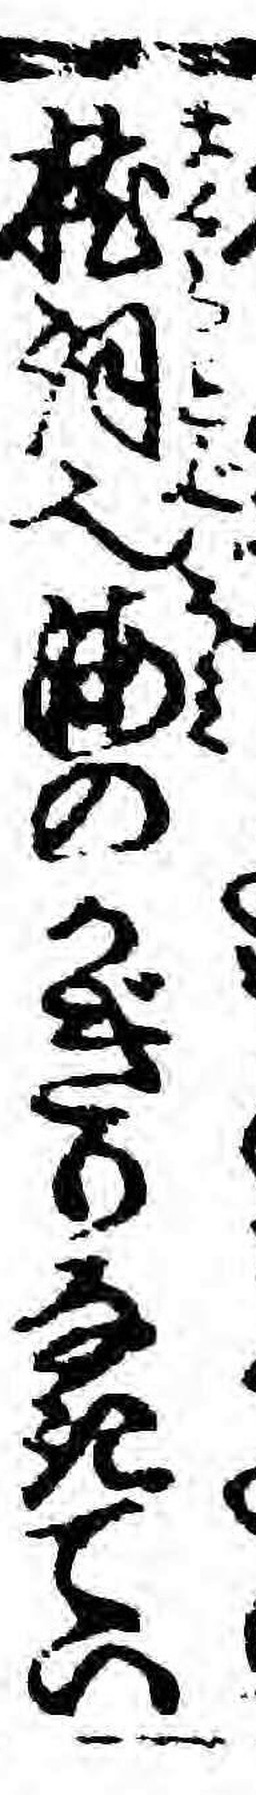枕詞也海のかぎりなきてい
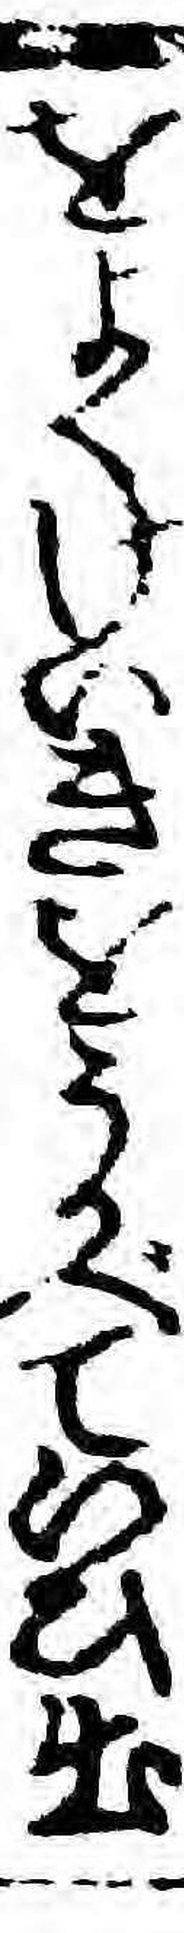をよくけいきをうかべていひ出
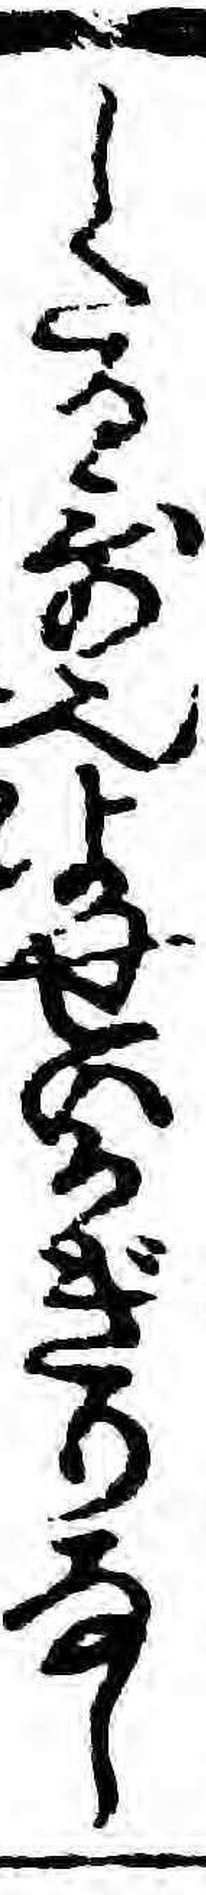したる哥也よせいかぎりなし
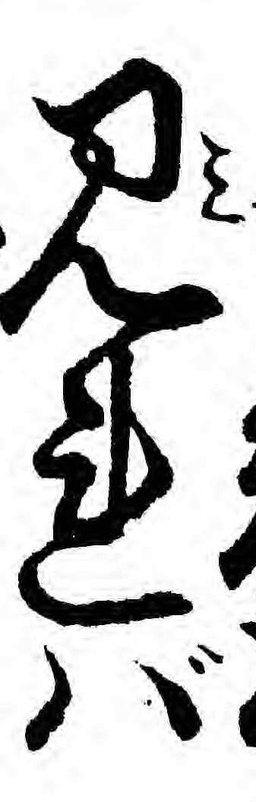見れば
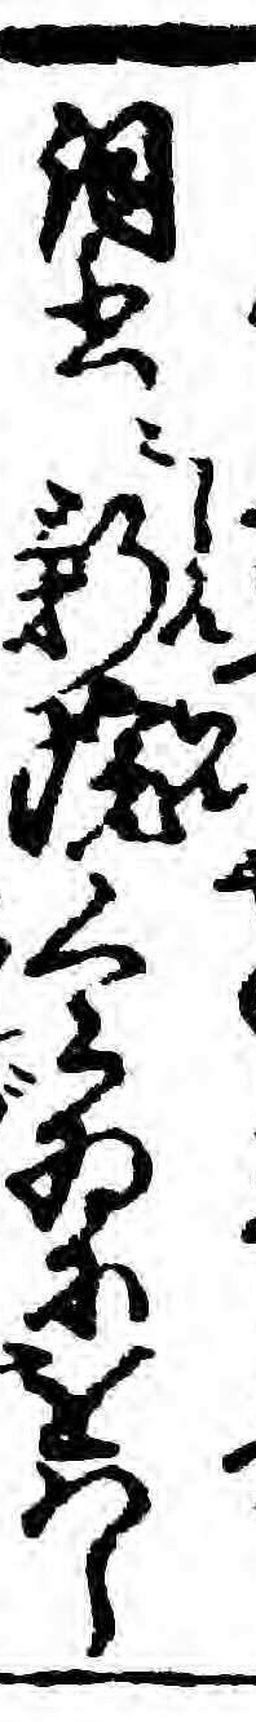詞書に新院くらゐにをはし
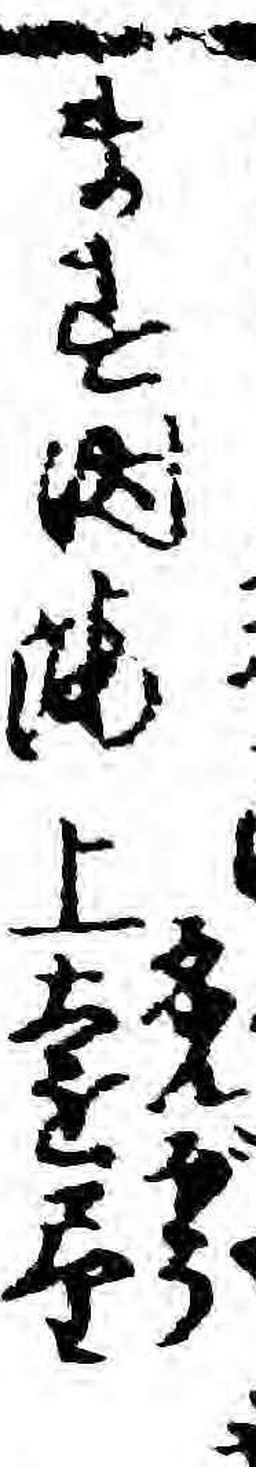ます時海上遠望
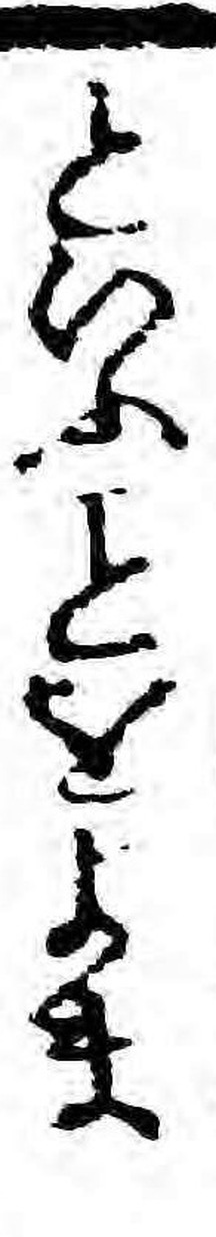といふことをよま
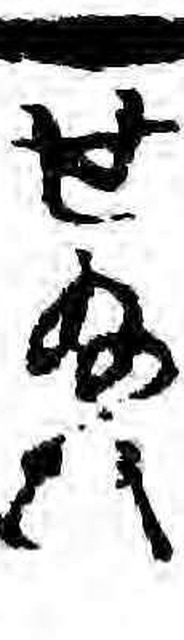せ給ひ
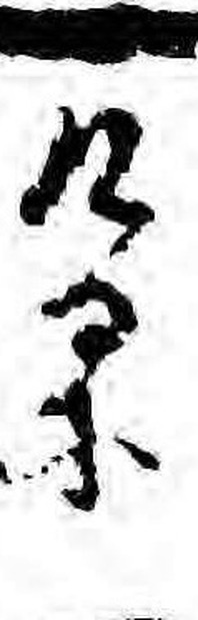けるに
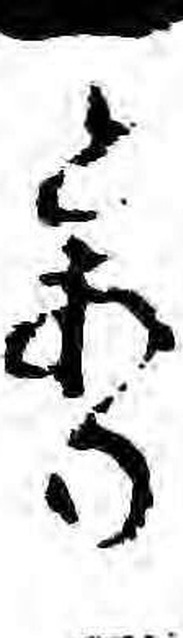とあり
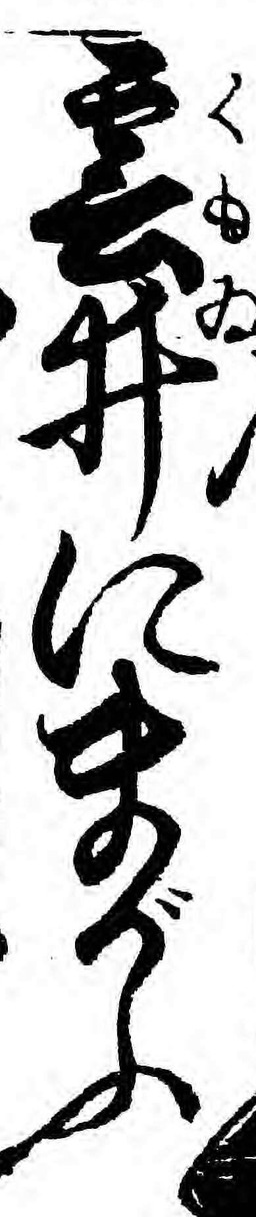雲井にまがふ
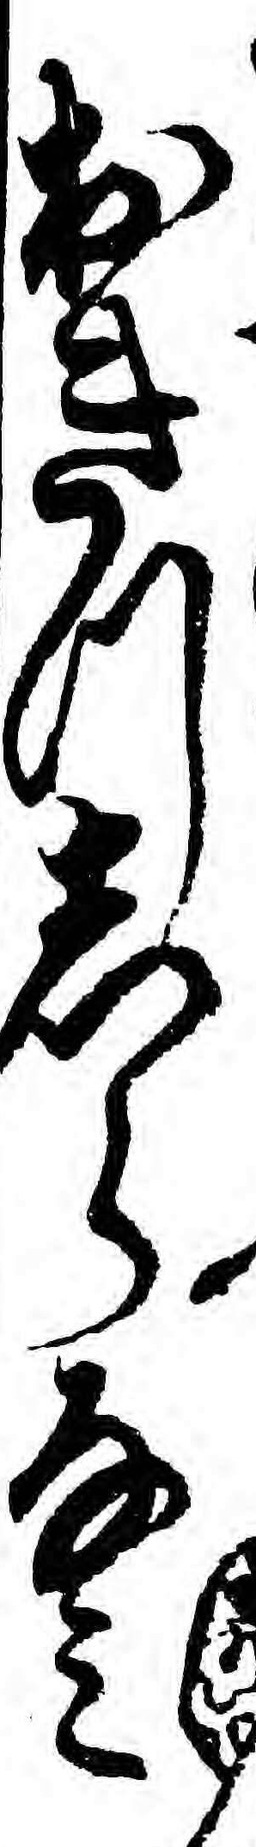おきつしらなみ
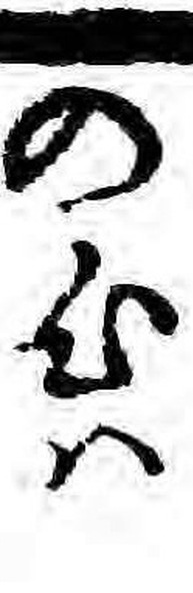の心は
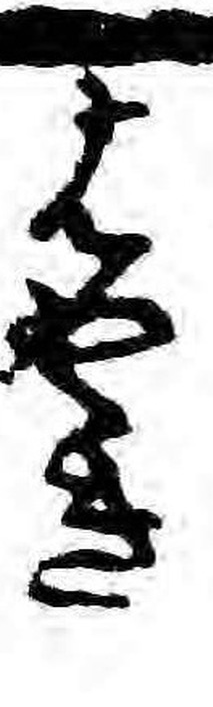はやき
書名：頭書和歌注譯／壽賀多百人一首小倉錦
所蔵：国文学研究資料館
